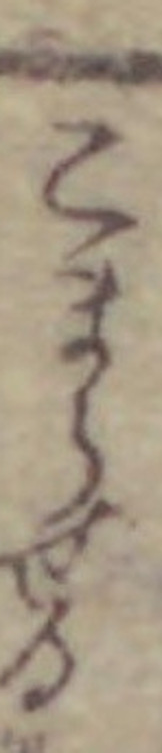こまらせる
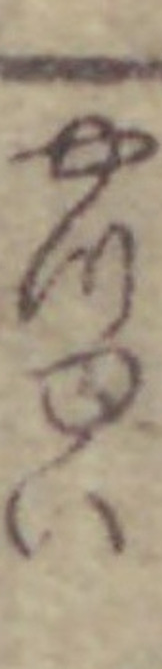やつゆい
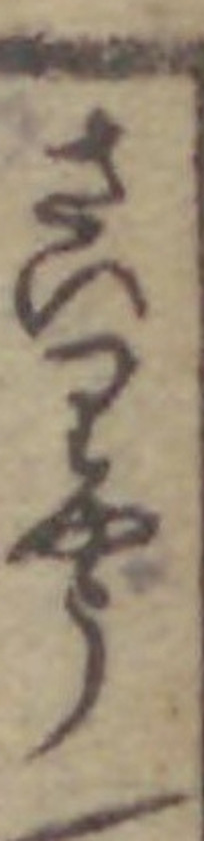さいりやう
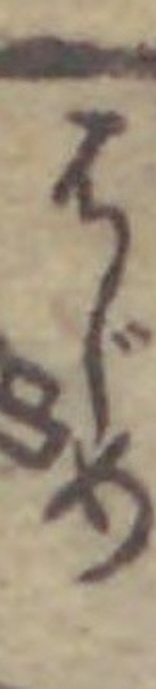はじめ
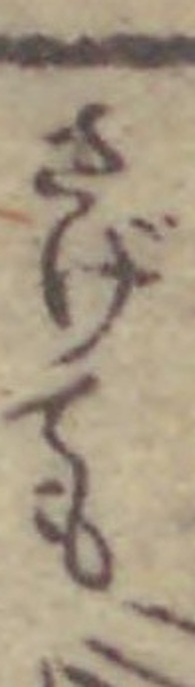さげても
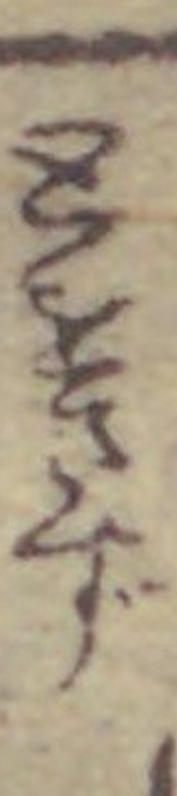とをさず
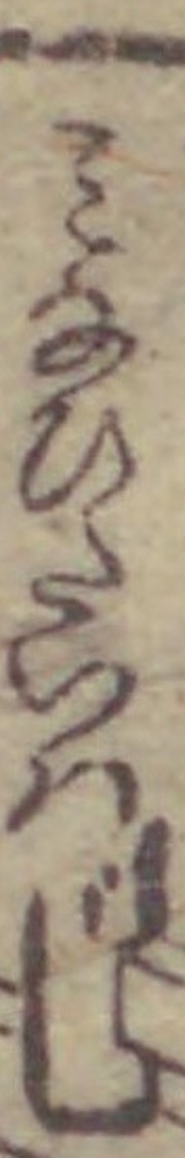みなひたいは
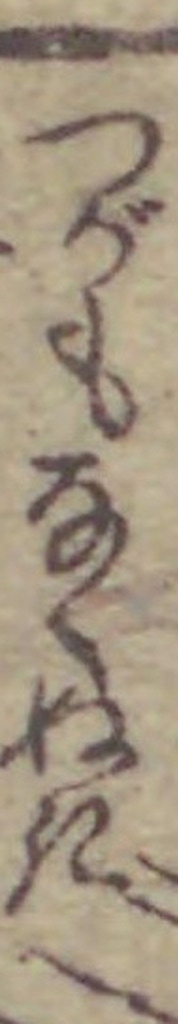つがもなくぬき
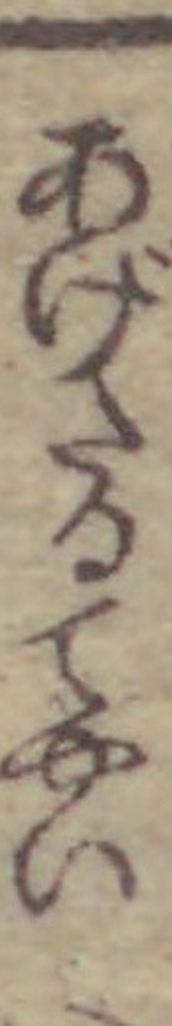あげたるてやい
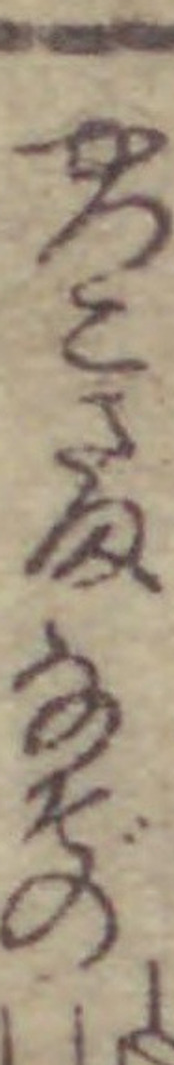やつこさまなぞの
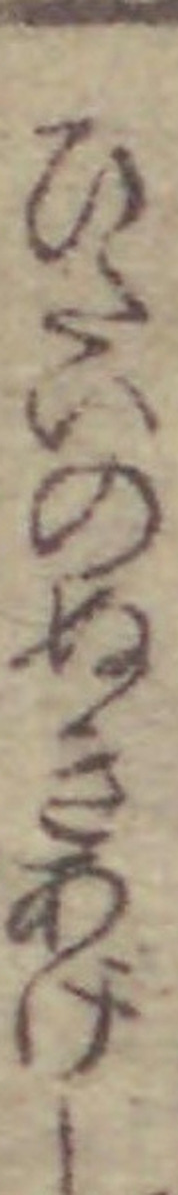ひたいのぬきあけ
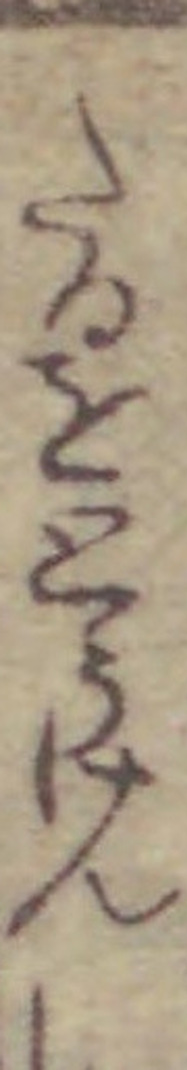たるをとうけん
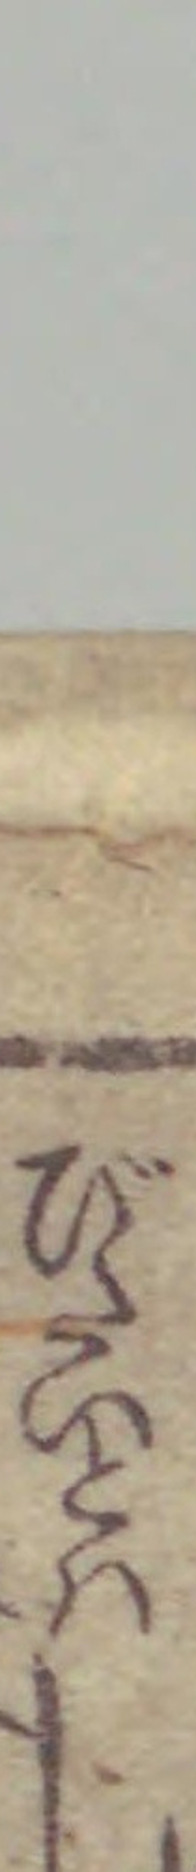びたいとは
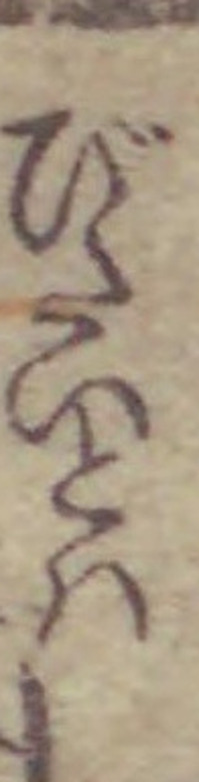びたいとは

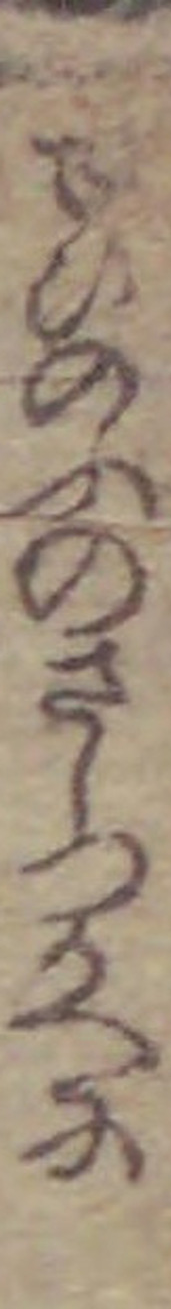ゆひのふのさしつかへに
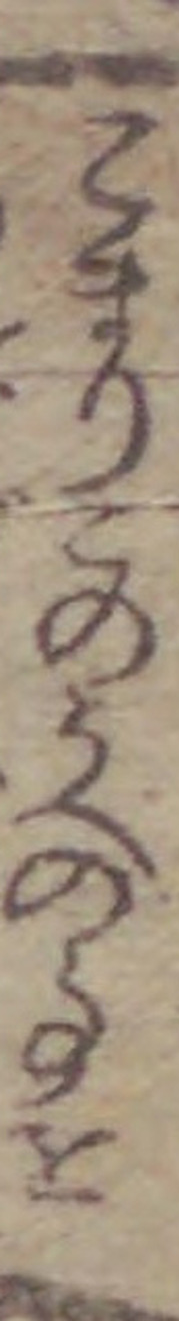こまりこのうへの事を
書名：狆の嫁入 2巻
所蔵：国立国会図書館 National Diet Library, JAPAN
